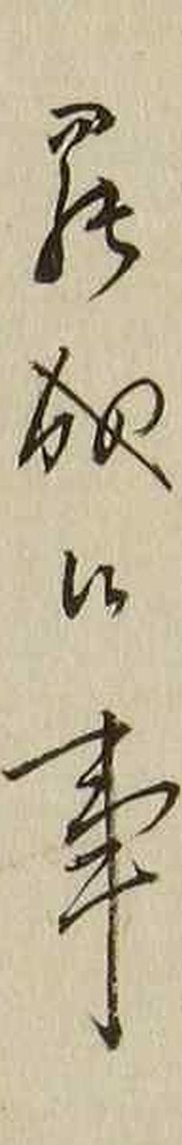罷成候事
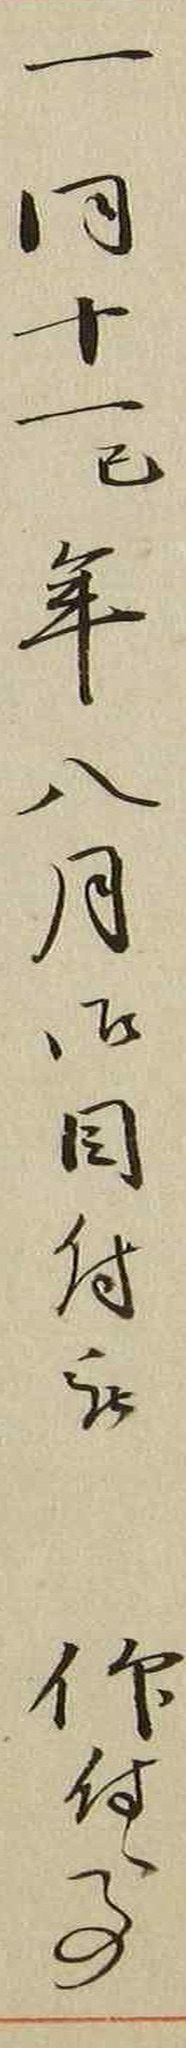一同十一巳年八月御目付被仰付候事
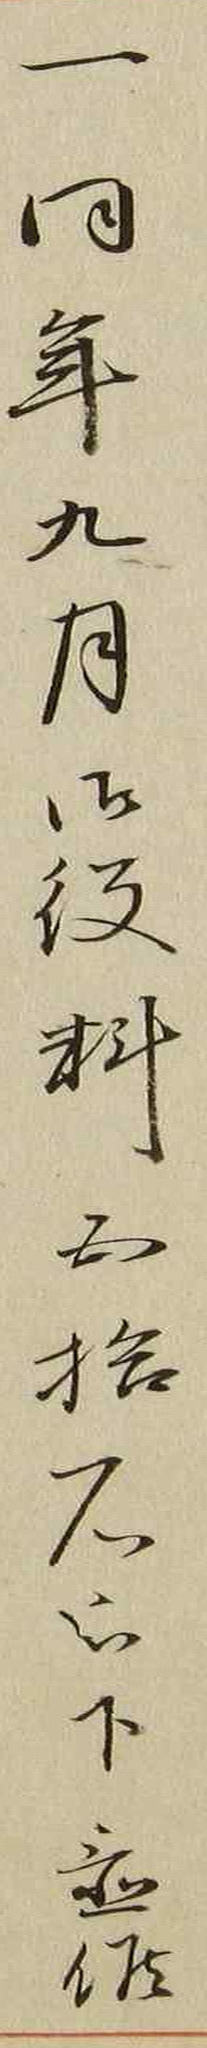一同年九月御役料五拾石被下置候
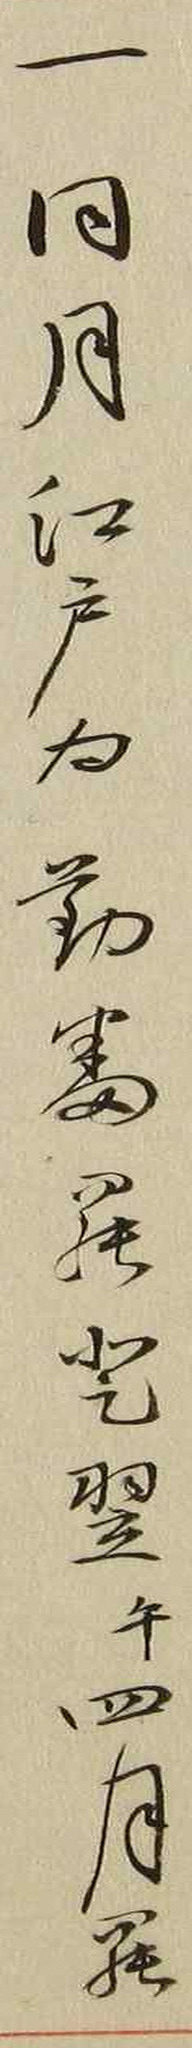一同月江戸為勤番罷登翌午四月罷
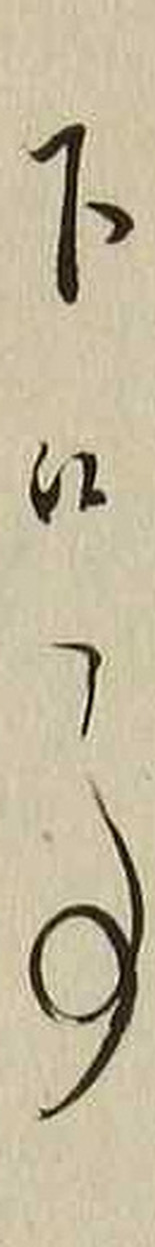下候事
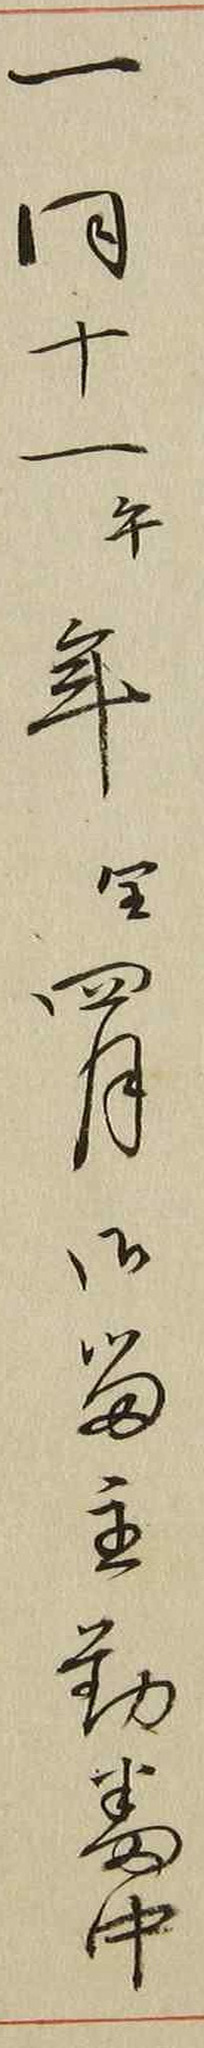一同十一午年閏四月御留主勤番中
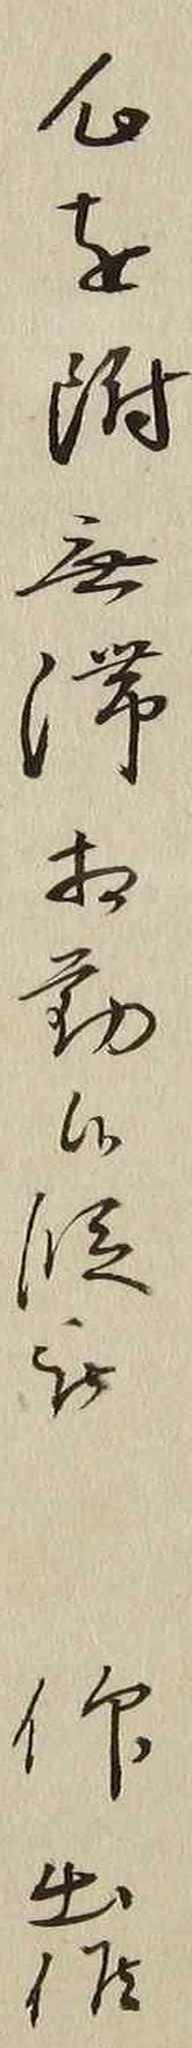心を附無滞相勤候段被仰出候
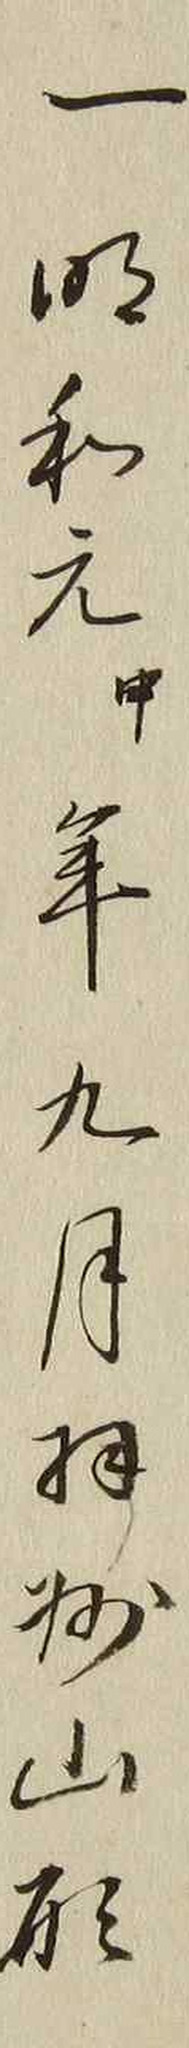一明和元申年九月羽州山形
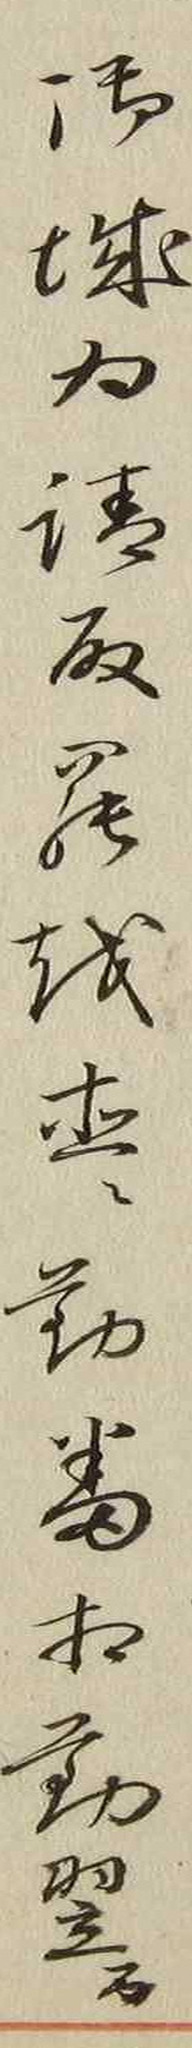御城為請取罷越直ニ勤番相勤翌酉
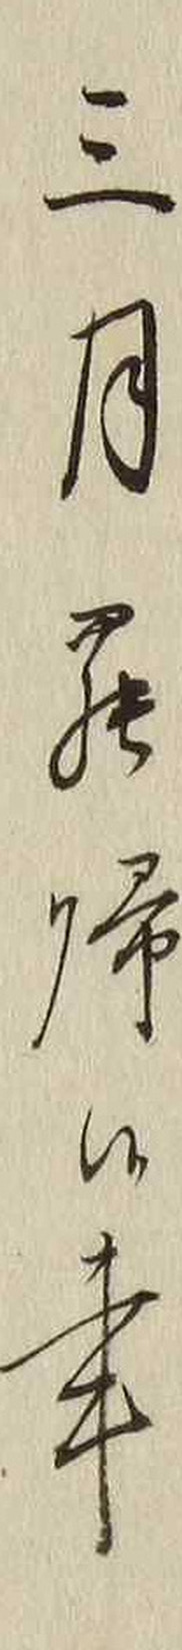三月罷帰候事
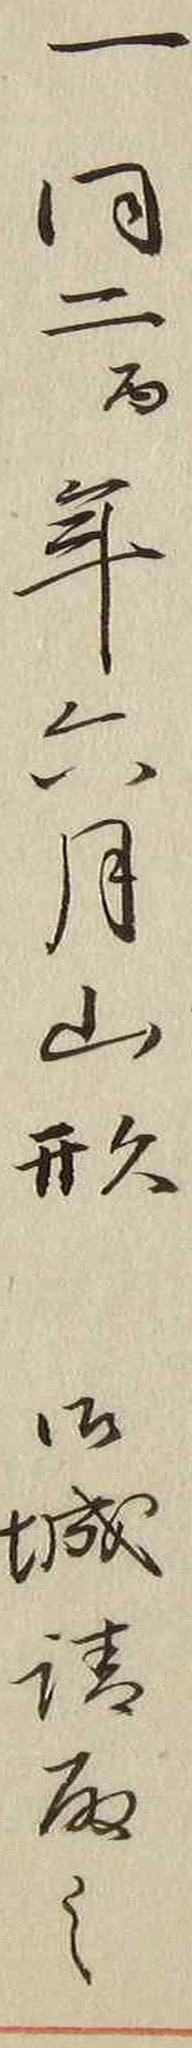一同二酉年六月山形御城請取之
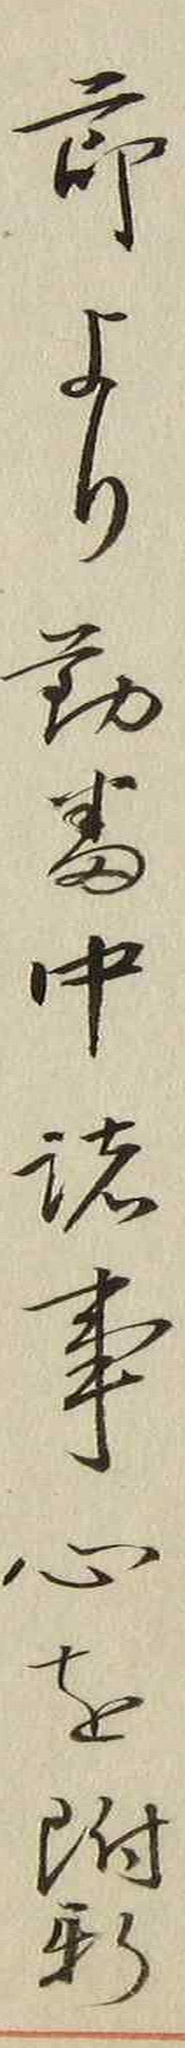節より勤番中諸事心を附新
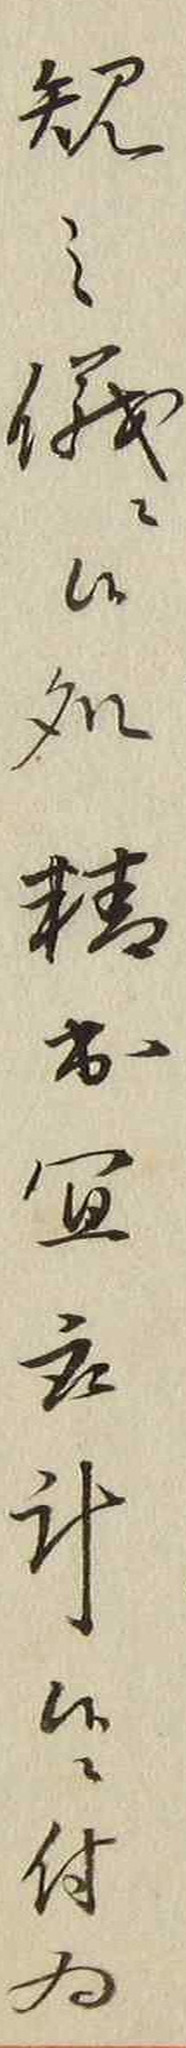規之儀ニ候処精出宜取計候ニ付為
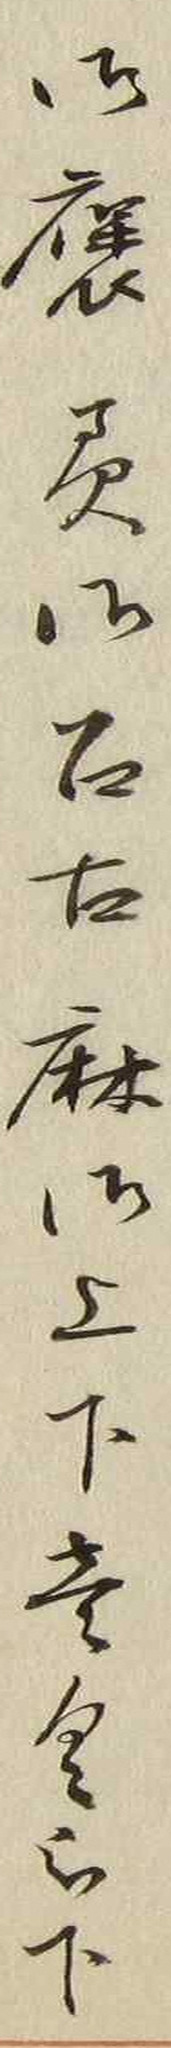御褒美御召古麻御上下壱具被下
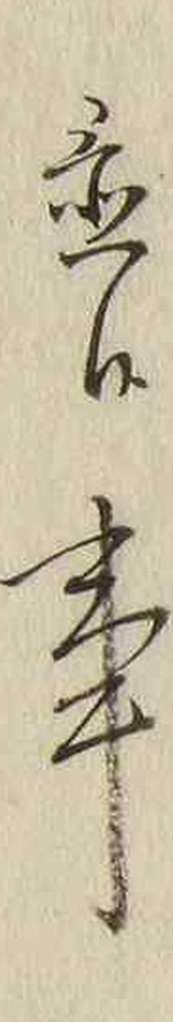置候事

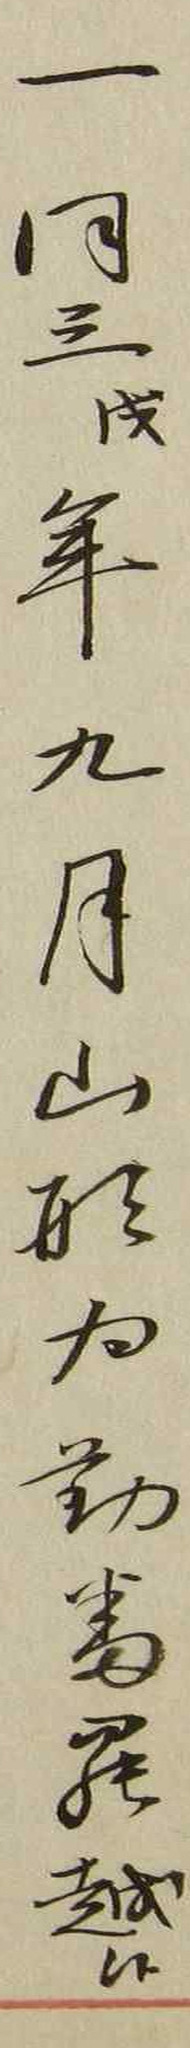一同三戌年九月山形為勤番罷越候
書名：諸士系譜　巻之22　い之部22
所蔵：会津若松市立会津図書館
